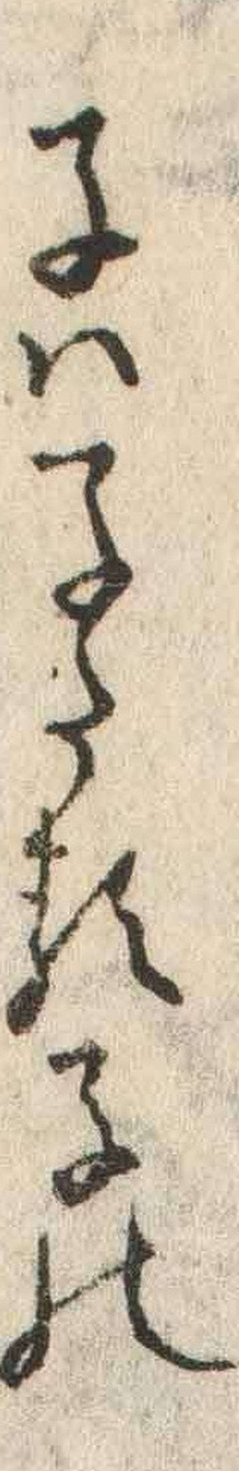子は子たる子の
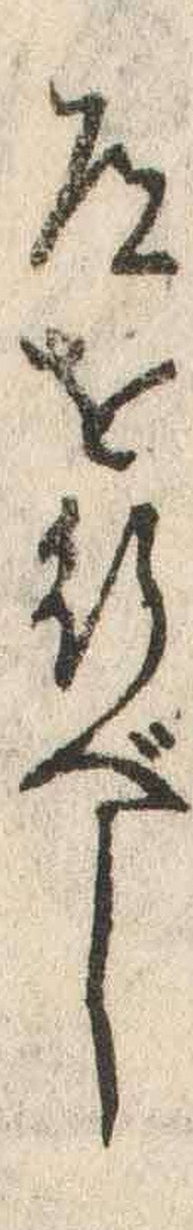道を行べし
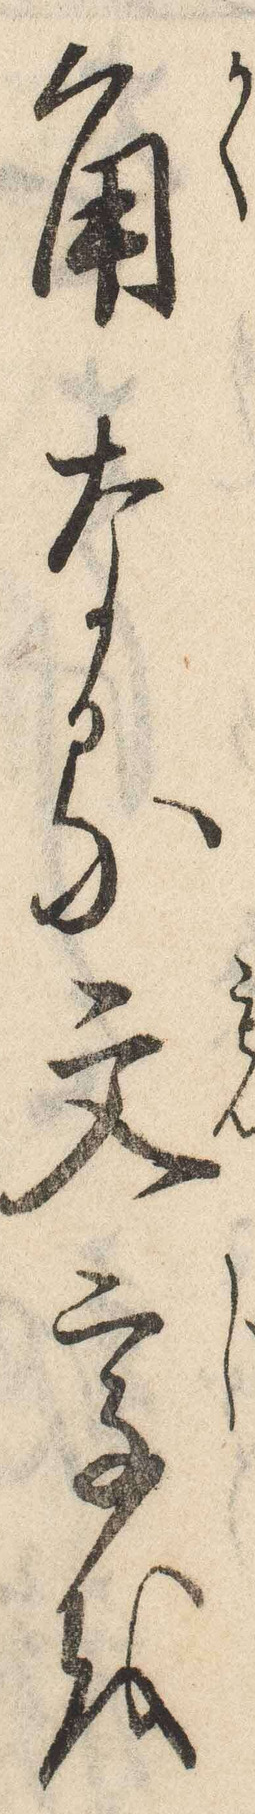角なる文字を
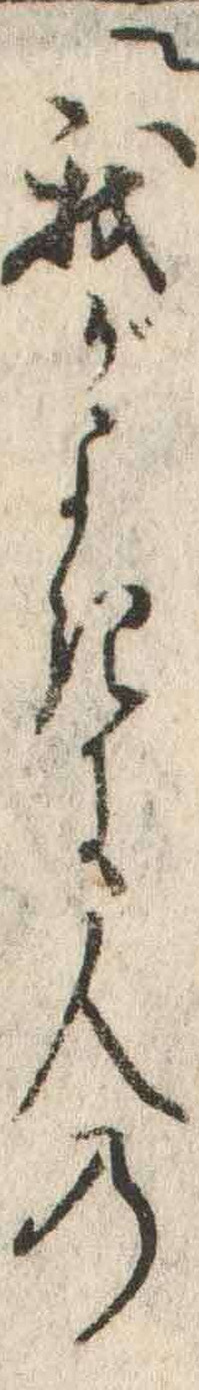〽我がよきに人の
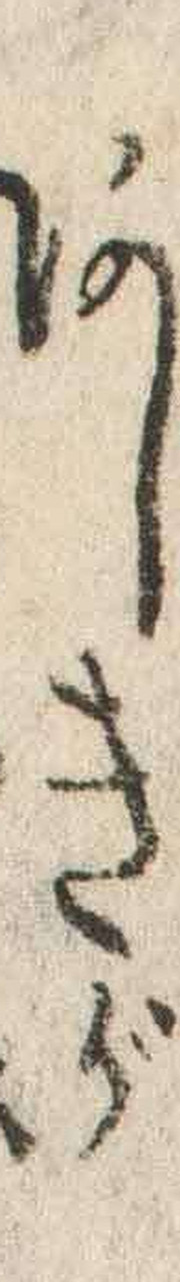あしきが
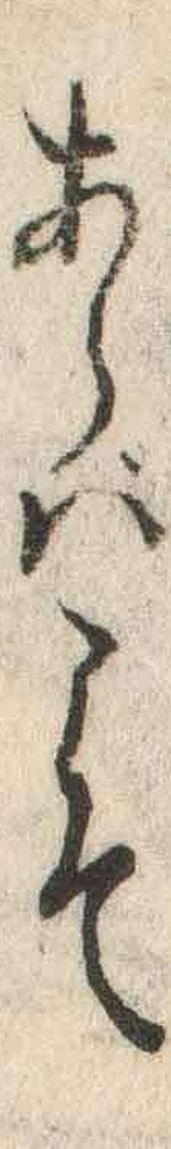あらばこそ
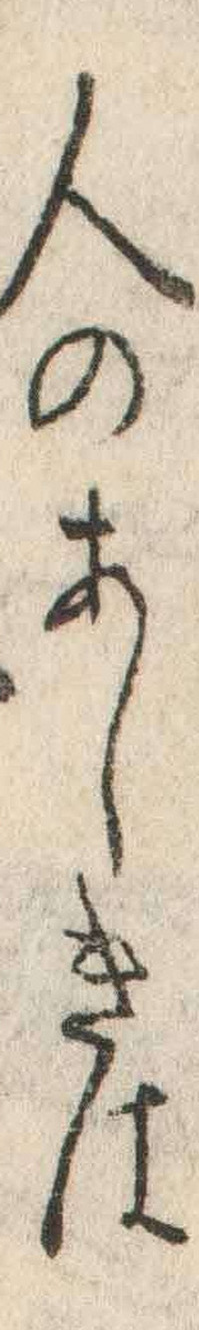人のあしきは
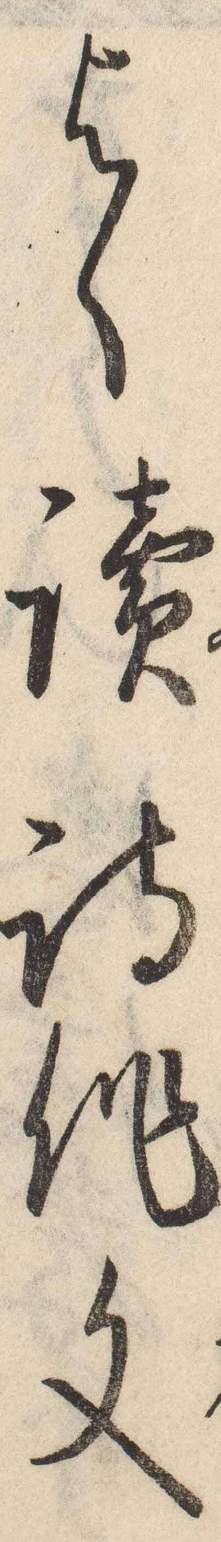よく読詩作文
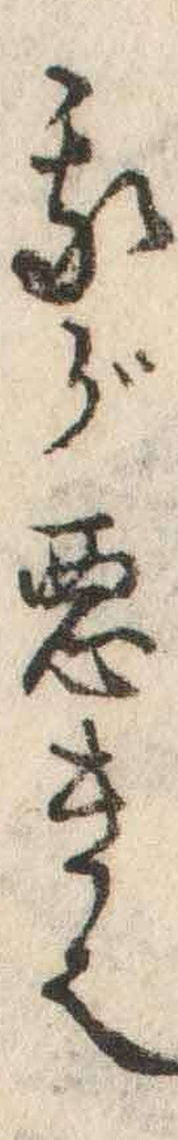我が悪き也
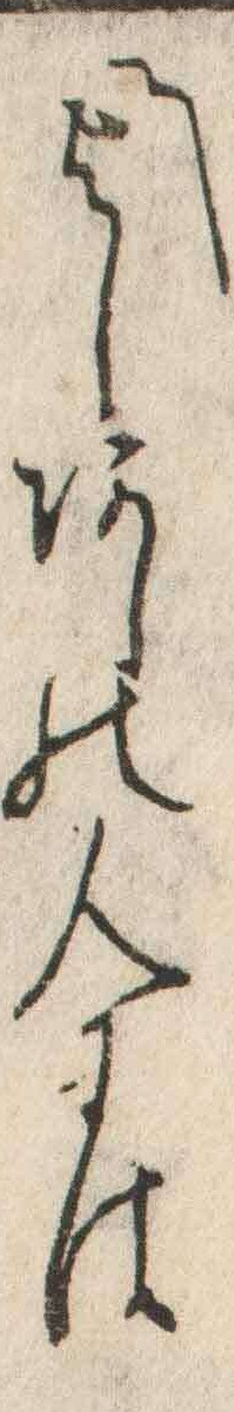〽よしあしの人には
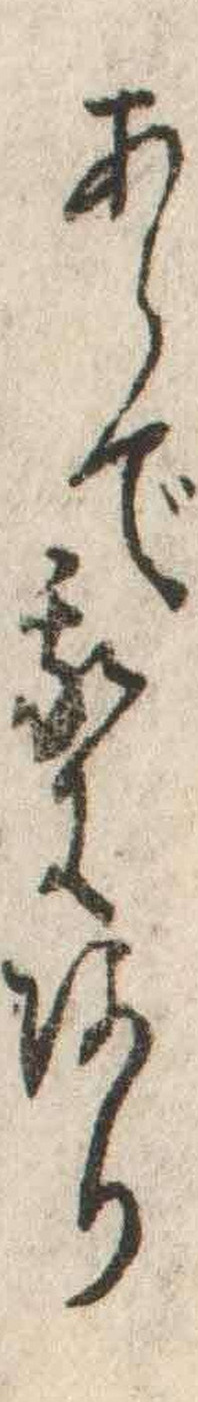あらで我にあり
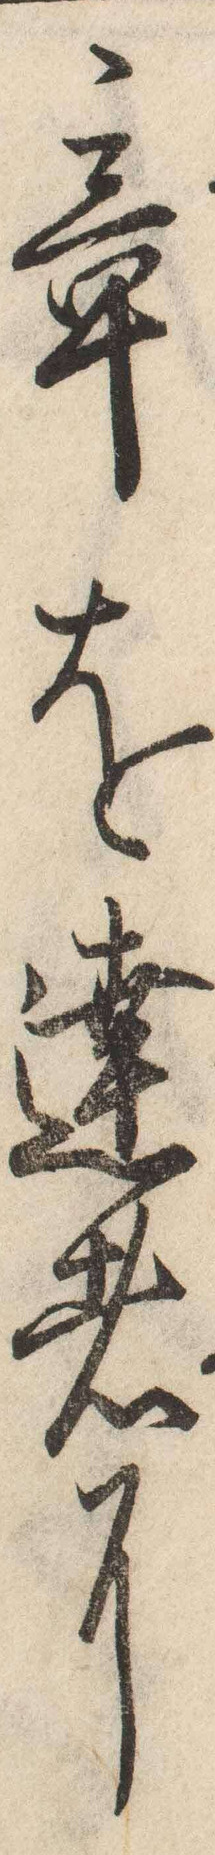章を達者に
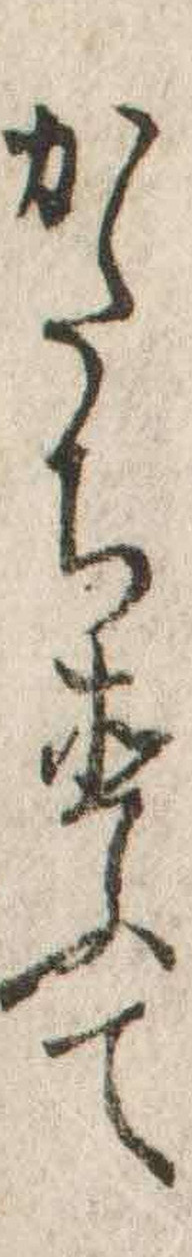かたち直ふて
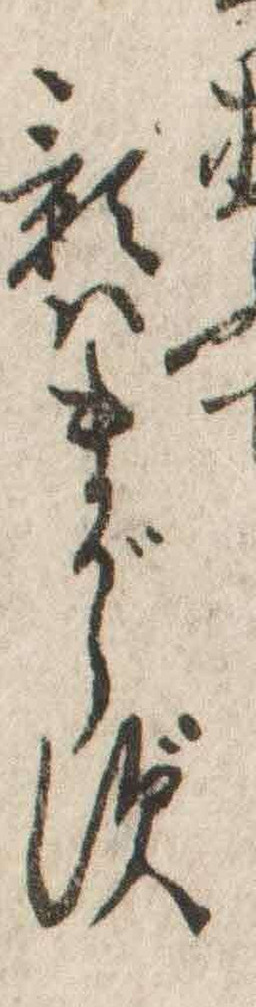影はまがらず
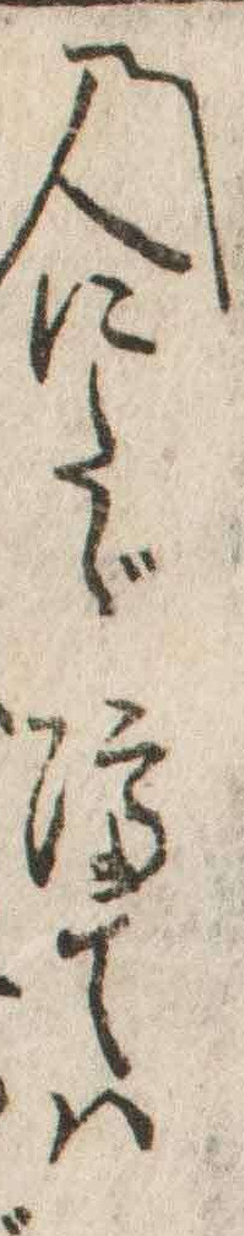〽人にたゞ済ては
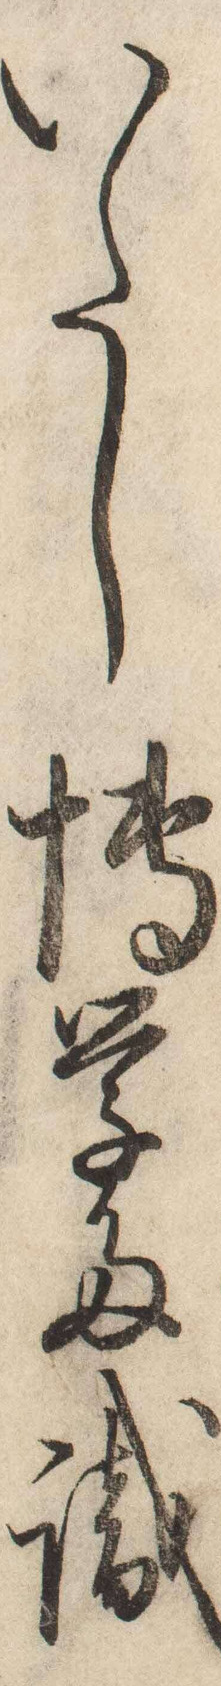いたし博学多識
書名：撫育草
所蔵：東京学芸大学附属図書館 国文学研究資料館
